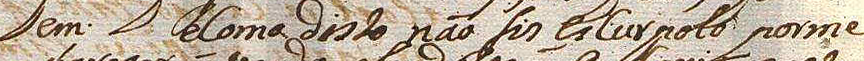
em. e Como disto naõ fis esCurpolo por me
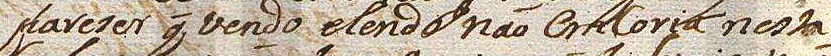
pareser q̄ vendo e lendo naõ emCorria nesta
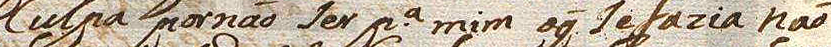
Culpa por naõ ser p.a mim o q̄ se fazia naõ
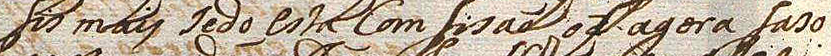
fis mais sedo esta Comfisaõ o q̄ agora faso
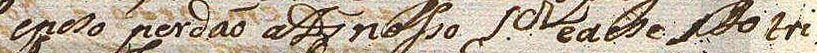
e peso perdaõ a Ds̄ nosso S.or e a ese s.to tri
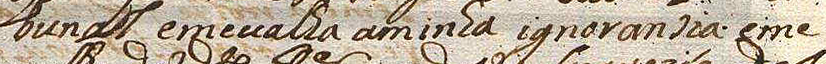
bunal e me ualha a minha ignoransia e me
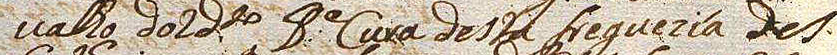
ualho do Rd.to P.e Cura desta freguezia de s.
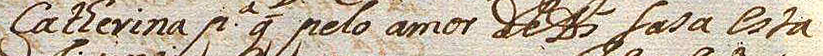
Catherina p.a q̄ pelo amor de Ds̄ fasa Esta
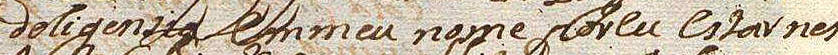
deligensia em meu nome por eu estar nes
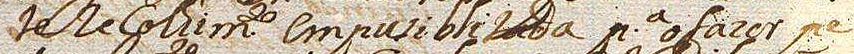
te Recolhim.to empusblitada p.a o fazer pe
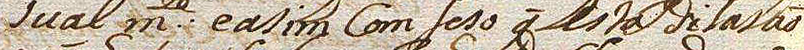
sualm.te e asim Comfeso q̄ esta dilasaõ
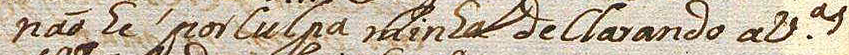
naõ he por culpa minha deClarando a V.as
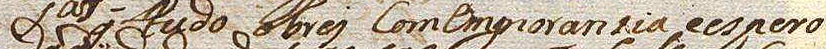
sas q̄ tudo obrej Com emgnoransia e espero
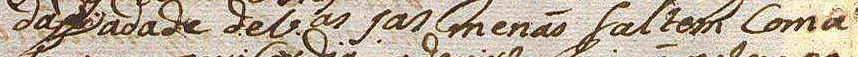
da piadade de V.as s.as me naõ faltem com a
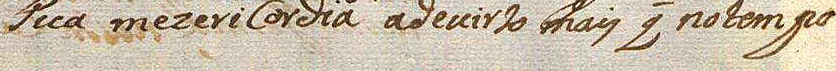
sua mezeriCordia adeuirto mais q̄ no tempo
